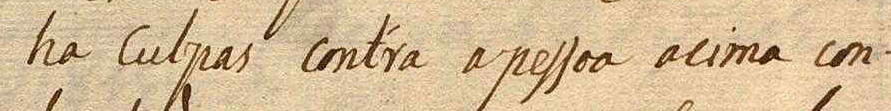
ha culpas contra a pessoa acima con
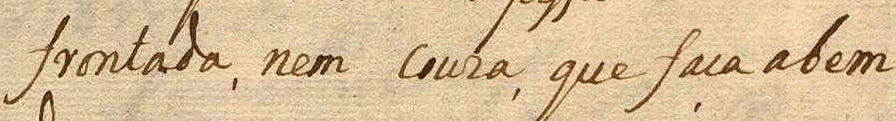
frontada, nem couza que faça a bem
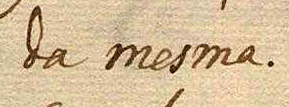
da mesma.
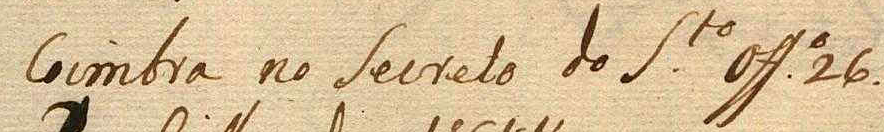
Coimbra no Secreto do S.to off.o 26.
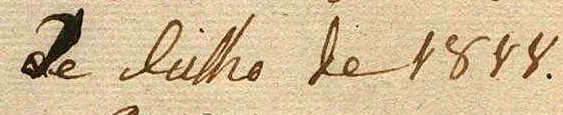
de Iulho de 1811.
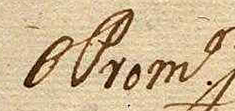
O Prom.or
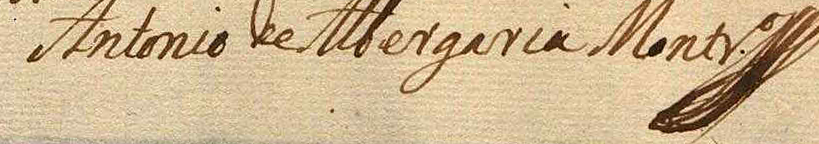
Antonio de Albergaria Montr.o
